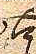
gl̄z
